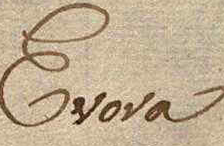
Evora
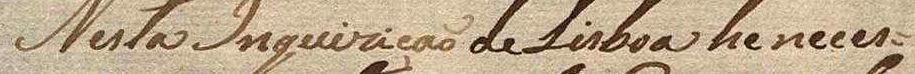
Nesta Inquiziçaõ de Lisboa he neces
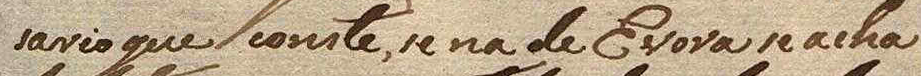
tario que conste, se na de Evora, se acha
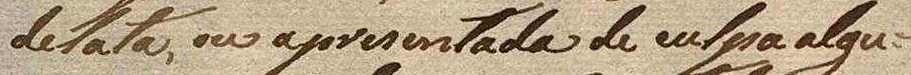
delata, ou apresentada de culpa algu
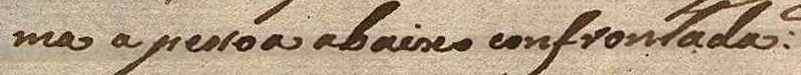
ma a pessoa abaixo confrontada:
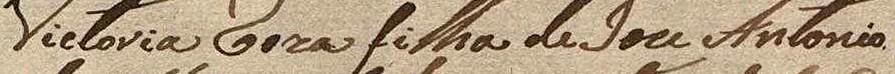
Victoria Roza filha de Ioze Antonio.
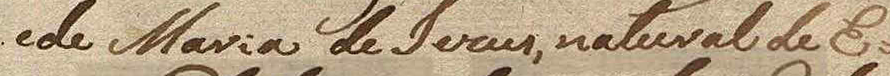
e de Maria de Iezus, natural de E
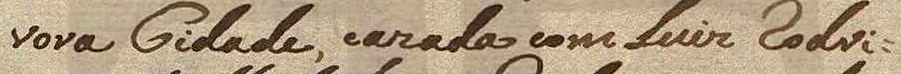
vora Cidade, cazada com Luiz Rodri
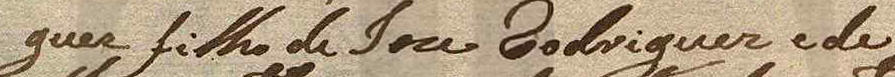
guez filho de Ioze Rodriguez, e de
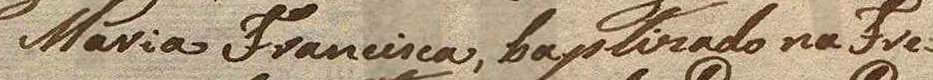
Maria Francisca, baptizado na Fre
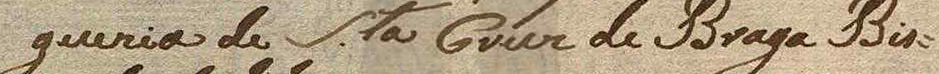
guezia de S.ta Cruz de Braga Bis
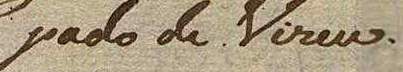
pado de Vizeu.
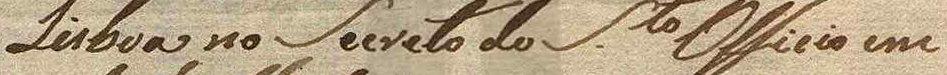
Lisboa no Secreto do S.to Officio em
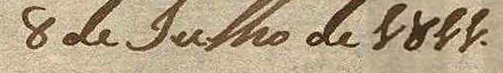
8 de Iulho de 1811.
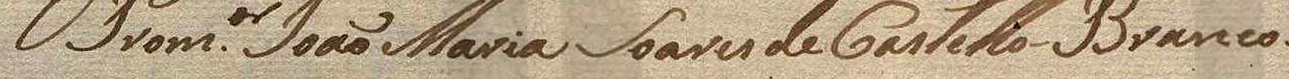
O Prom.or Ioaõ Maria Soares de Castello-Branco.
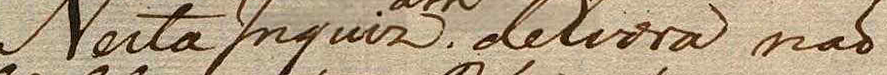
Nesta Inquiz.am de Evora naõ
